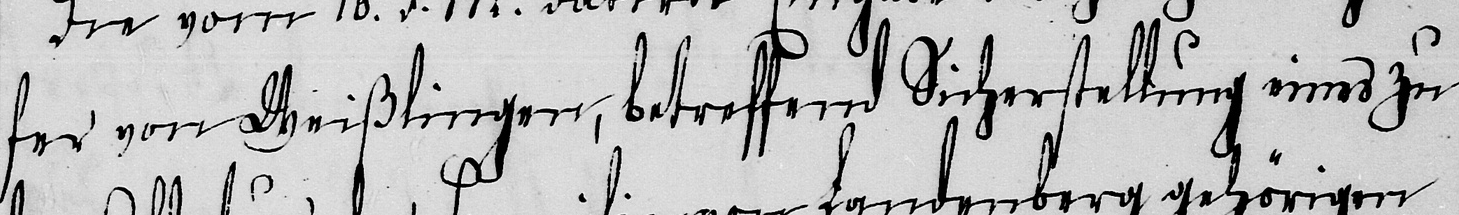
fer von Weißlingen, betreffend Sicherstellung eines zu
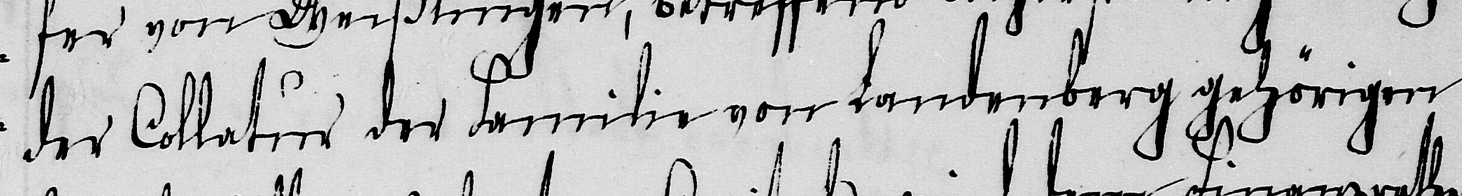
der Collatur der Familie von Landenberg gehörigen
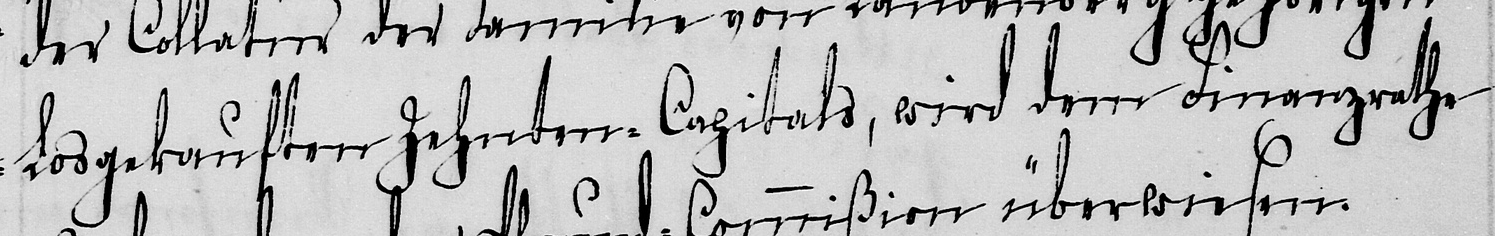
Losgekauften Zehnten-Capitals, wird dem Finanzrathe
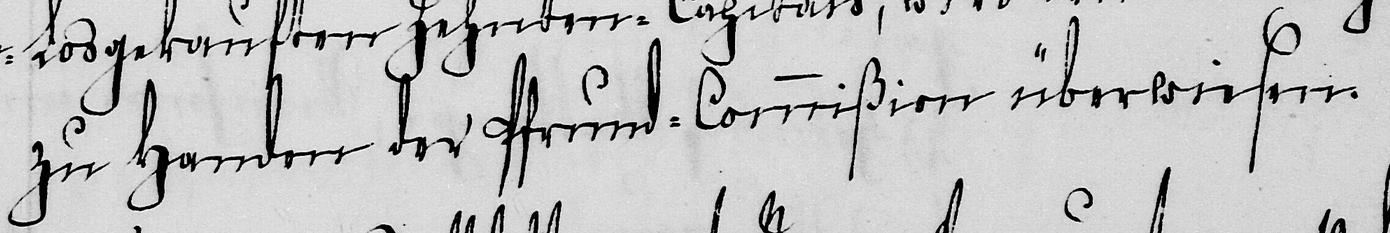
zu Handen der Pfrund-Commißion überwiesen.
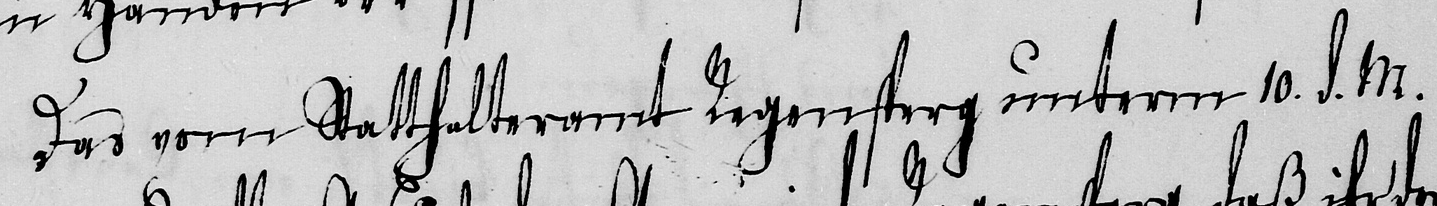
Das vom Statthalteramt Regensperg unterm 10. d. M.
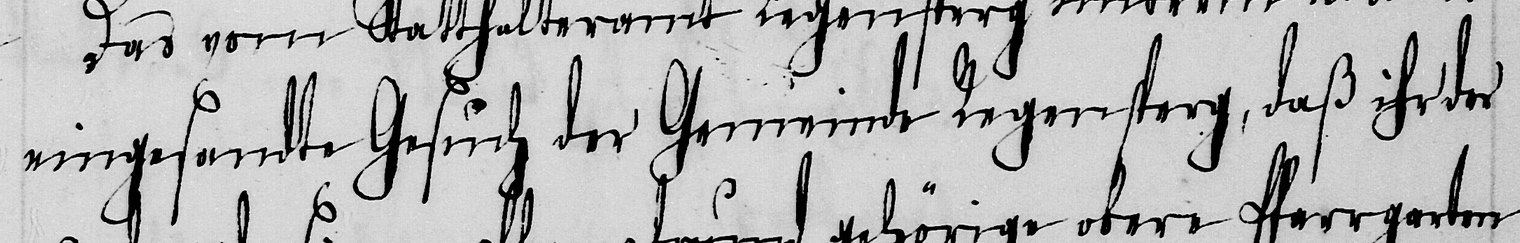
eingesandte Gesuch der Gemeinde Regensperg, daß ihr der
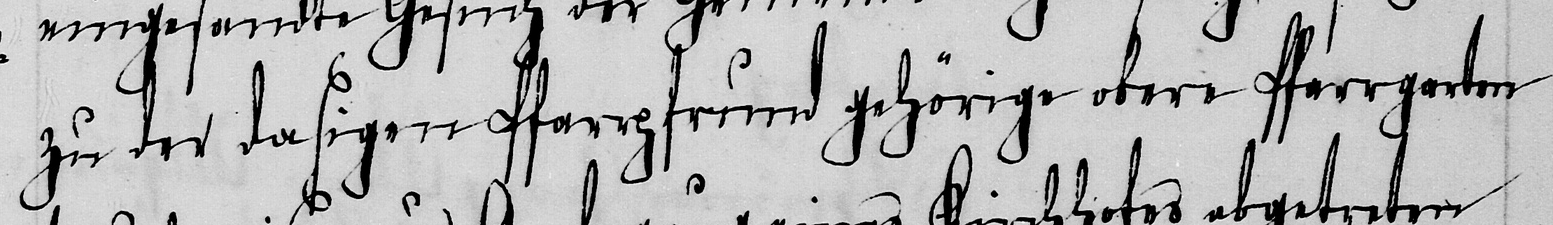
zu der dasigen Pfarrpfrund gehörige obere Pfarrgarten
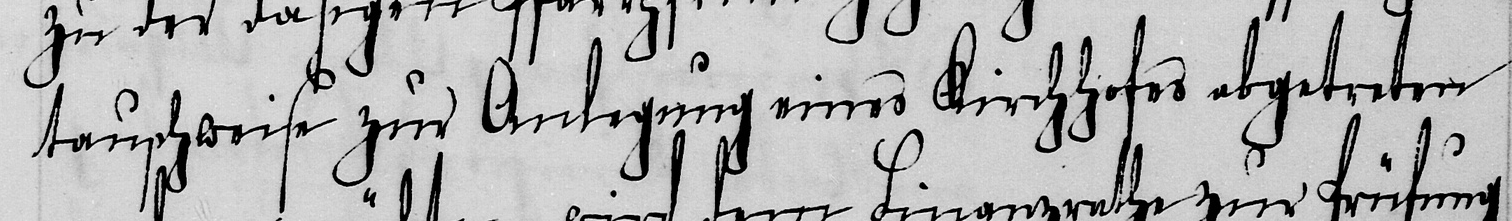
tauschweise zur Anlegung eines Kirchhofes abgetreten
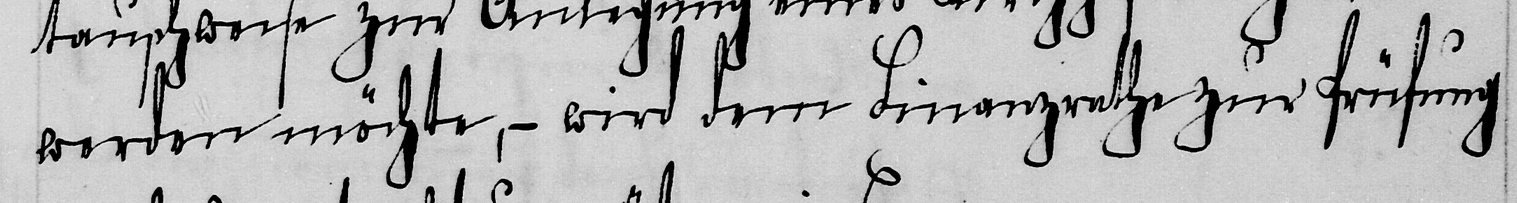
werden möchte, – wird dem Finanzrathe zur Prüfung
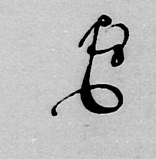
e.
